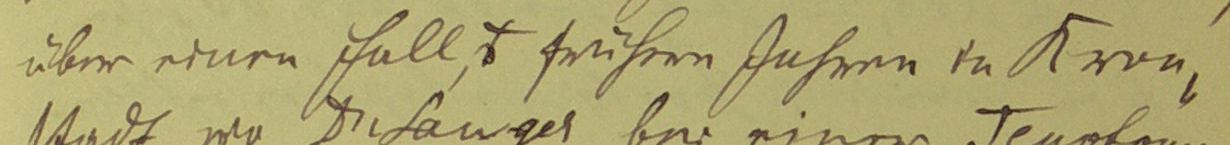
über einen Fall aus früheren Jahren in Kron¬
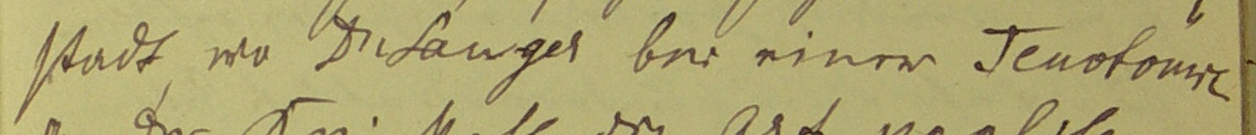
stadt, wo Dr. Langer bei einer Tenotenur
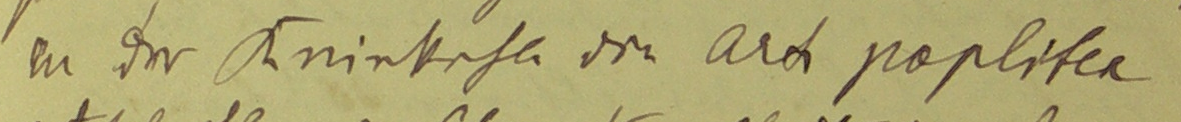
in der Kniekehle die Art. Poplitea
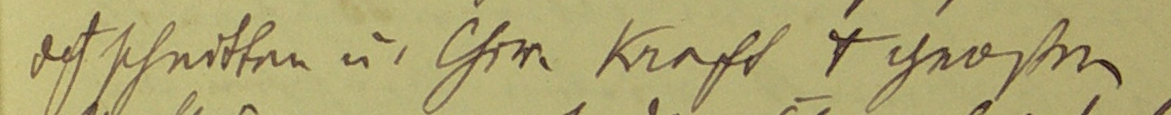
durchschnitten und Chiru. Kraft mit großer
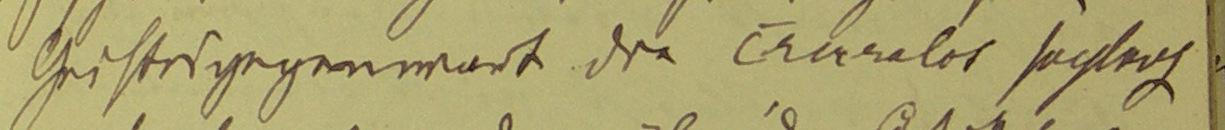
Geistesgegenwart die Crurralot fachlich
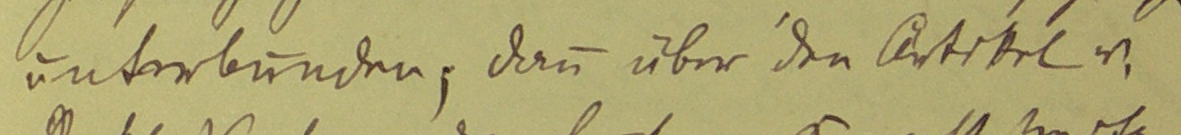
unterbunden;-dann über den Artikel von
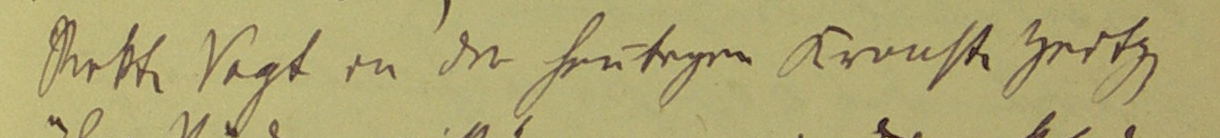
Rektor Vogt in der heutigen Kronstädter Zeitung „
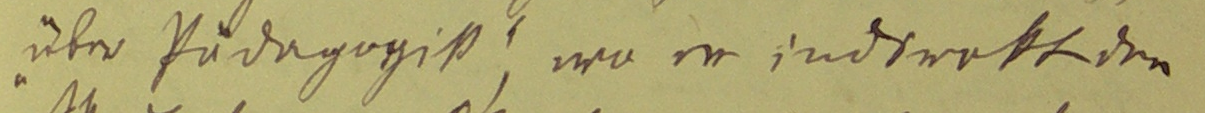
über Pädagotik „, wo er indirekt den
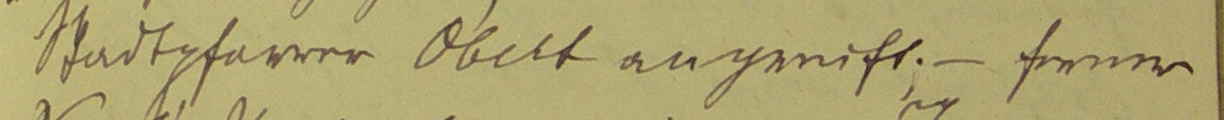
Stadtpfarrer Obert angreift;- seiner
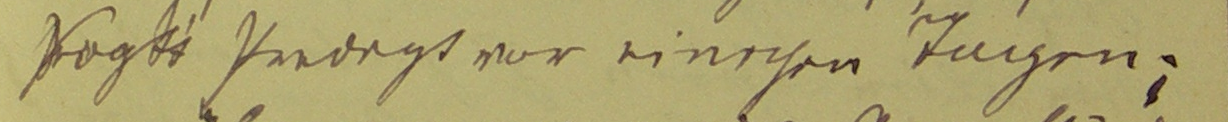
Vogts Predigt vor einigen Tagen;
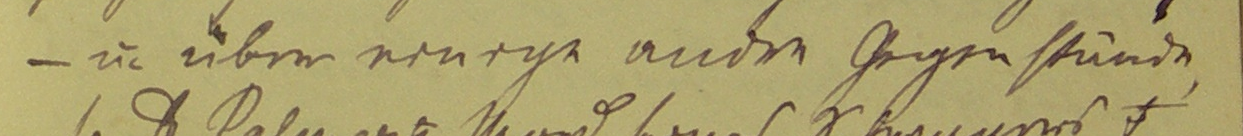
- und über einige andere Gegenstände
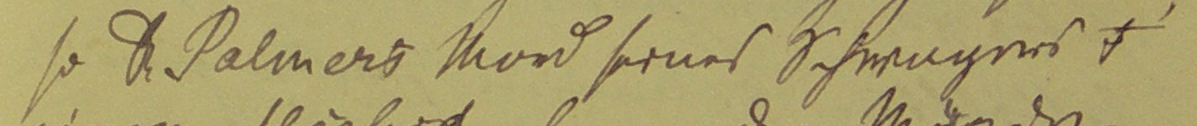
so Dr. Palmers Mord seines Schwagers mit
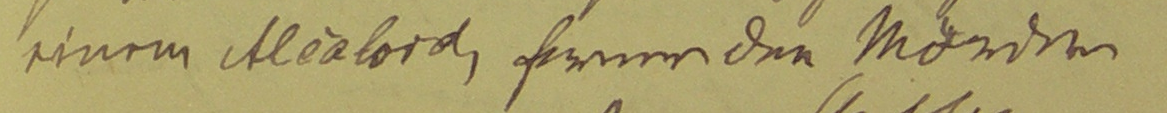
einem Tlealord, ferner den Mördern
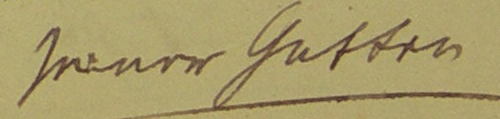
seiner Gattin---
